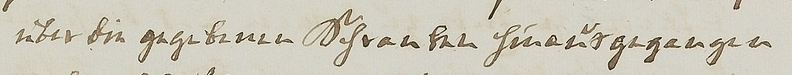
über die gegebenen Schranken hinausgegangen
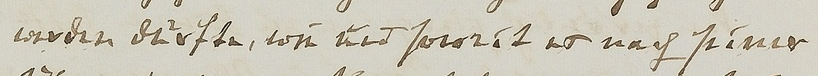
werden dürfte, wie und soweit es nach seiner
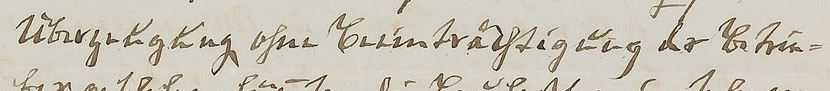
Überzeugung ohne Beeinträchtigung des Betrie-
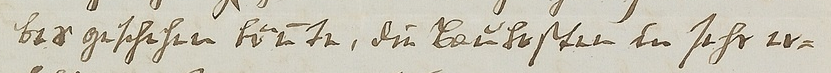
bes geschehen könnte, die Baufristen in sehr er-
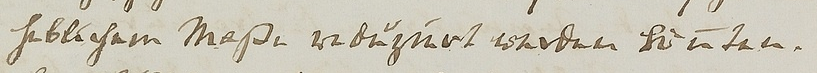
heblichem Maße reduziert werden könnten.
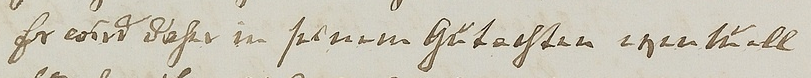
Er wird daher in seinem Gutachten eventuell
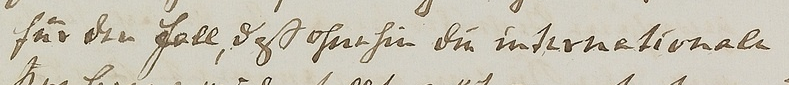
für den Fall, daß ohnehin die internationale
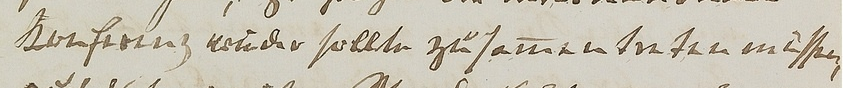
Konferenz wieder sollte zusammentreten müssen,
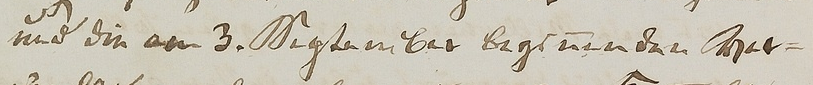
und die am 3. September beginnenden Ver-
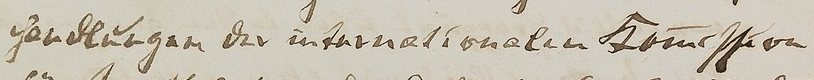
handlungen der internationalen Kommission
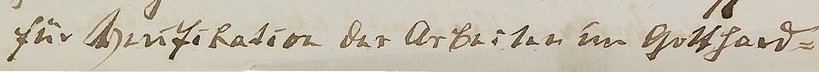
für Verifikation der Arbeiten im Gotthard -
